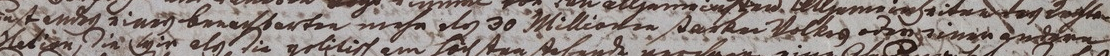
zustandes eines benachbarten mehr als 30 Millionen starken Volkes oder einer andern
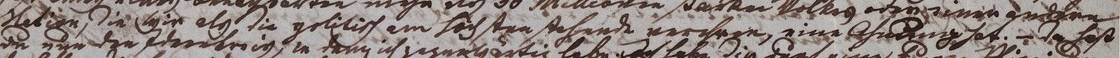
Nation, die wir als die politisch am höchsten stehende verehren, eine Ahnung hat. – Da hast
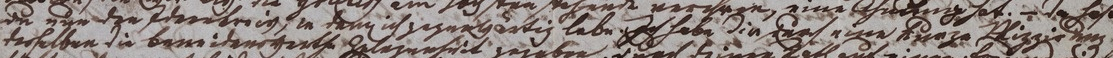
Du nun den Ideenkreis, in dem ich gegenwärtig lebe. Ich habe Dir durch eine kurze Skizzirung
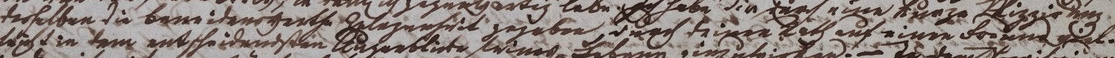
desselben die beneidenswerthe Gelegenheit gegeben, durch Deinen Rath auf einen Freund viel-
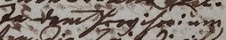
In dem Provisorium,
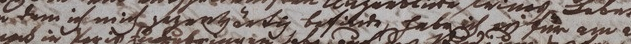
in dem ich mich gegenwärtig befinde, habe ich es für am
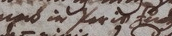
noch in Paris zuzubringen
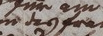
auf das Studium
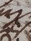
des
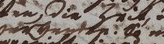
denn einige darauf
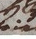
die
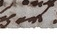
Gerichte
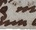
bis zum
